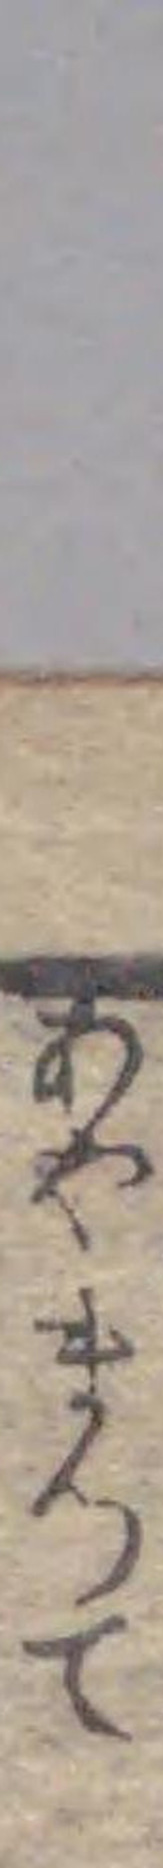あやまつて
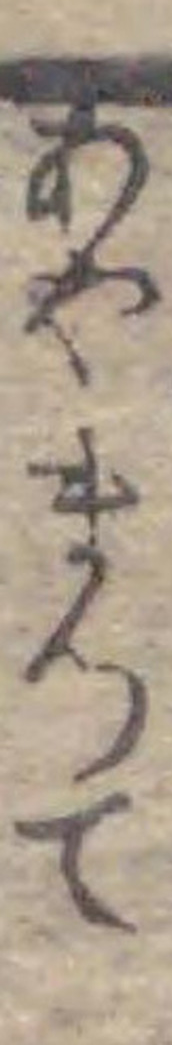あやまつて
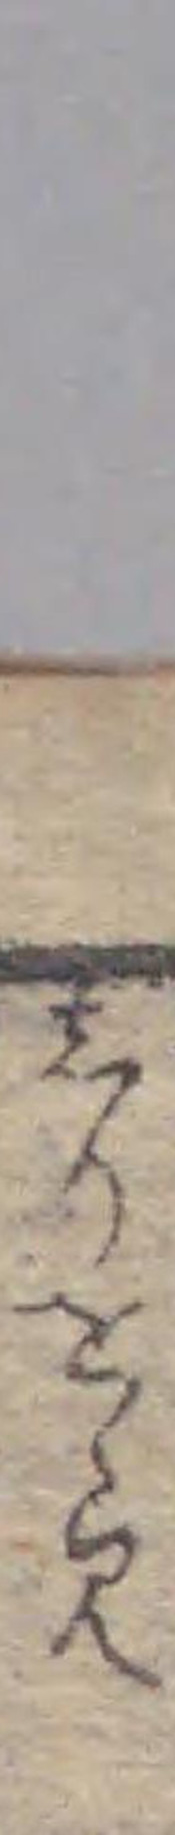しりをゝ見
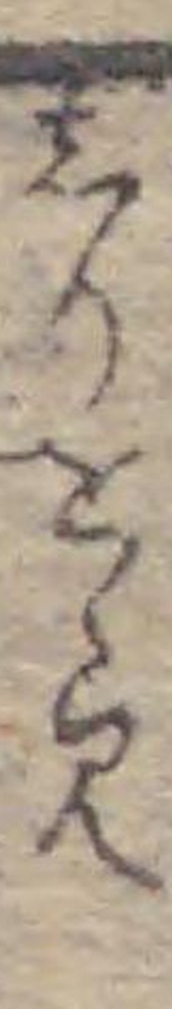しりをゝ見
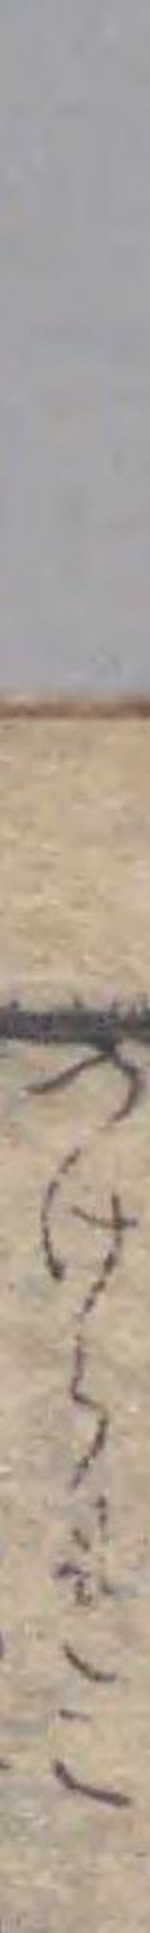つけられこ
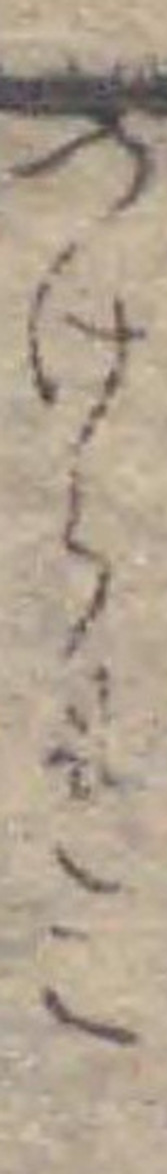つけられこ
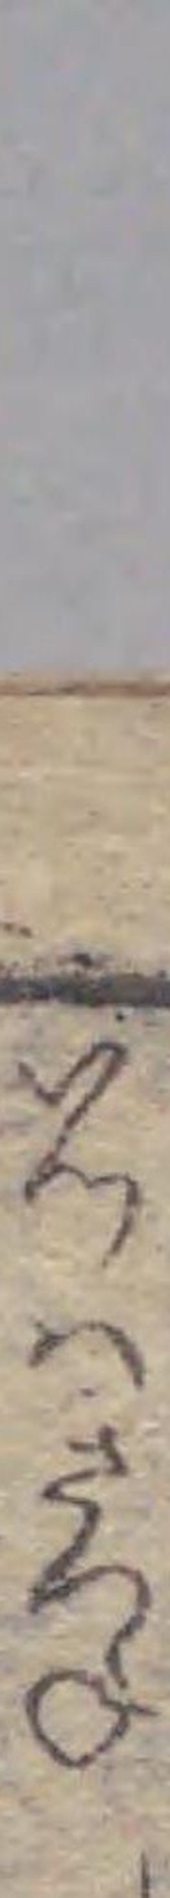いつはきつね
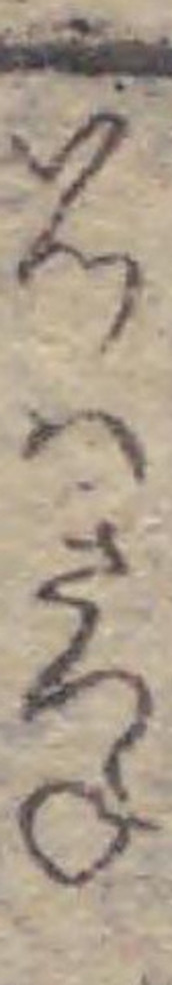いつはきつね
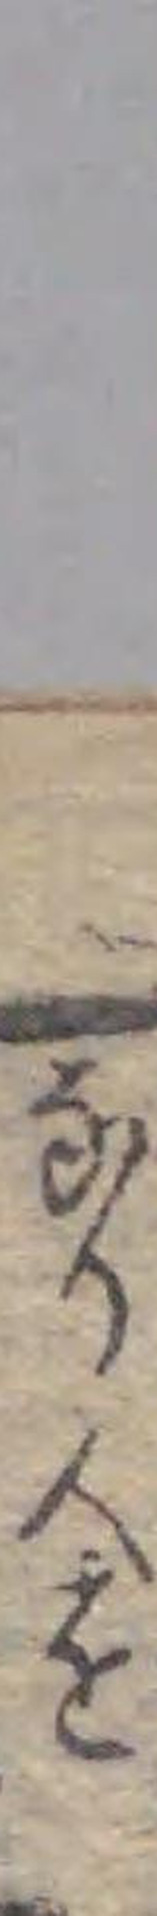なり人を
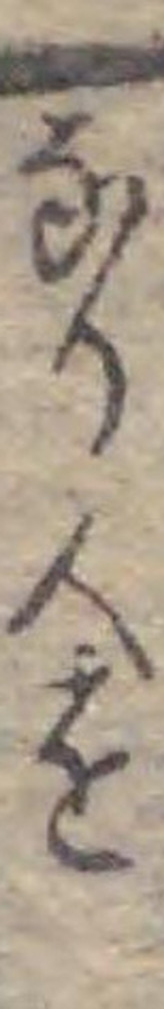なり人を
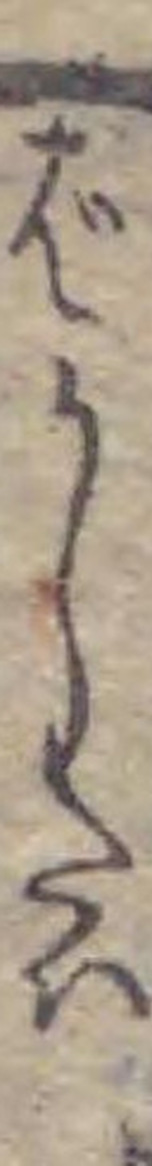ばかしたは
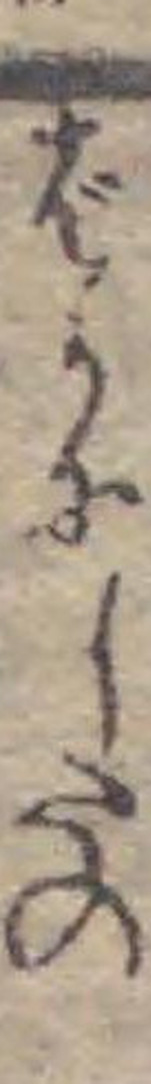ばかにしたの
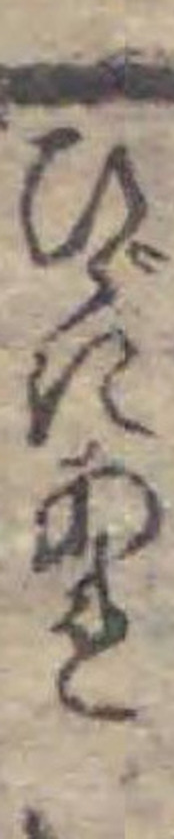ひゞきあれ
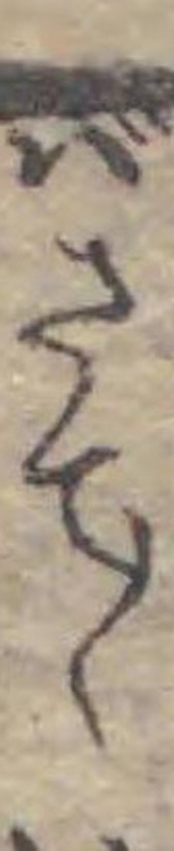ばさて〳〵
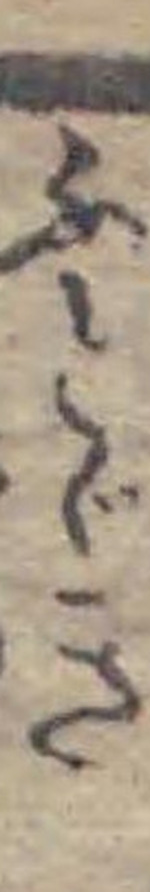ふとゞき
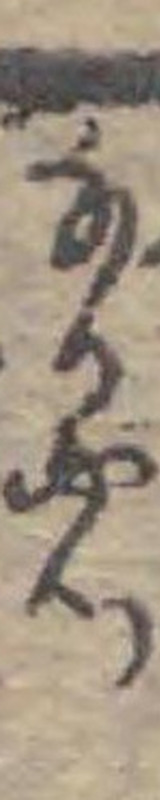なるやつ
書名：紺屋百物語 : 3巻
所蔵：国立国会図書館 National Diet Library, JAPAN
